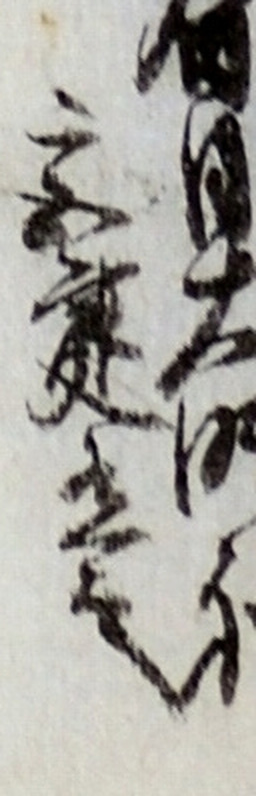宮建有之
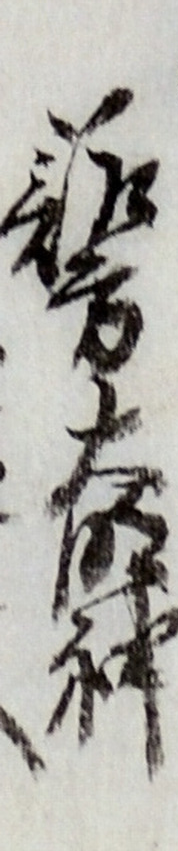春日大明神
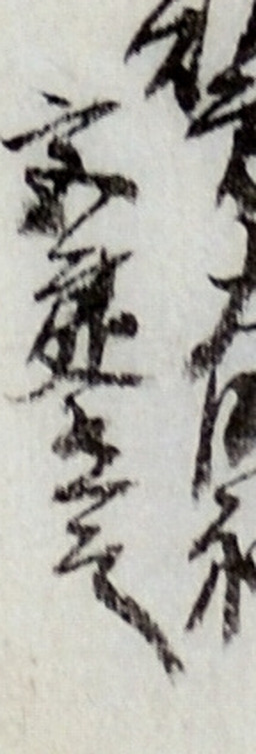宮建有之
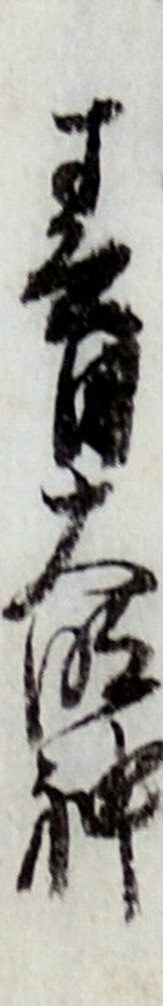春日大明神
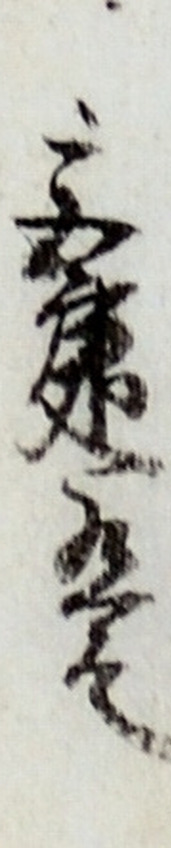宮建有之
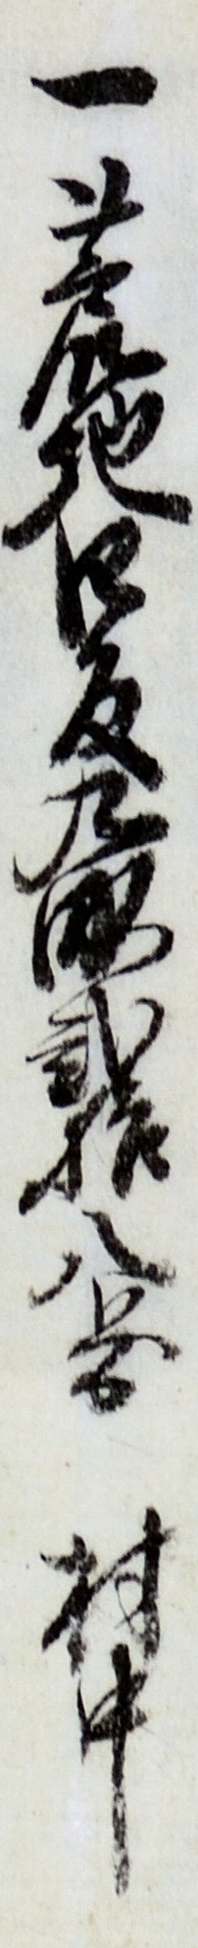一荒地四反九畝弐拾八歩村中
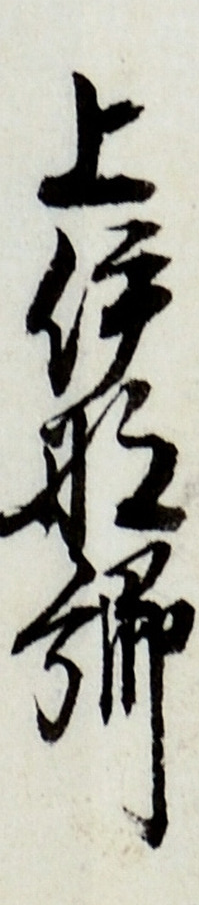上伊那郷
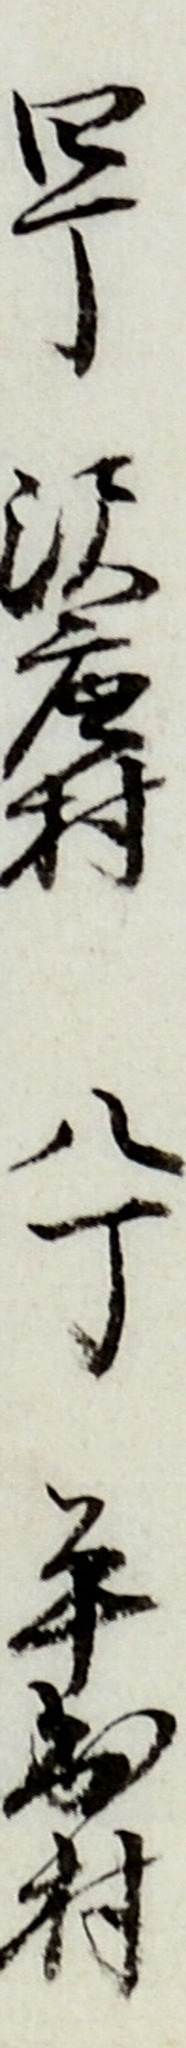四丁沢底村八丁平出村
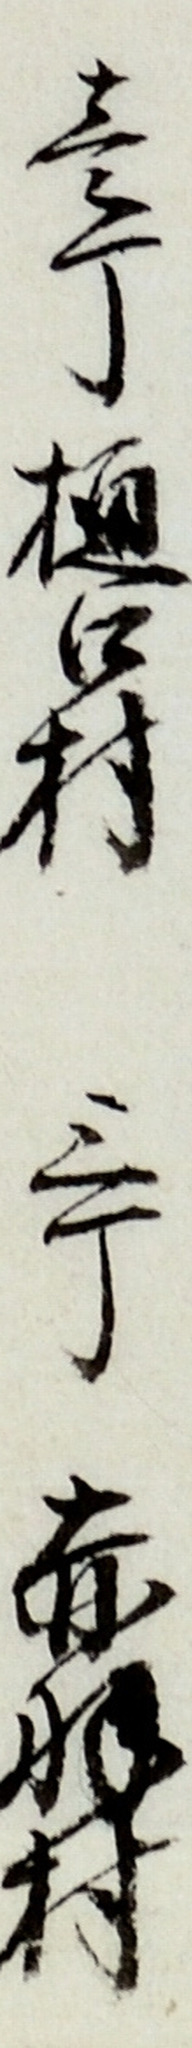壱丁樋口村三丁赤羽村
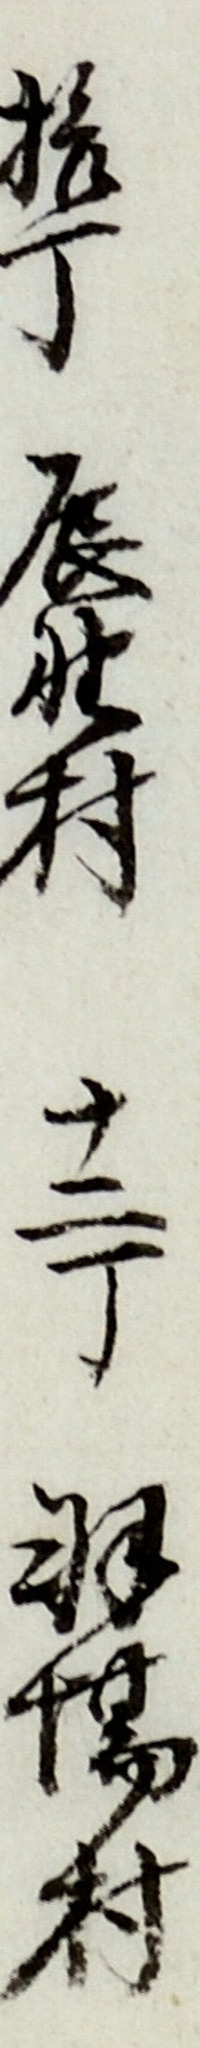拾丁辰野村十二丁羽場村
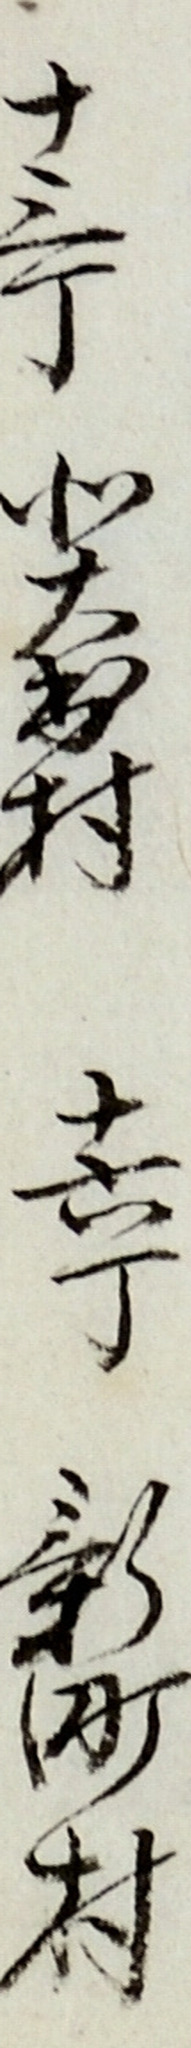十三丁北大出村十六丁新町村
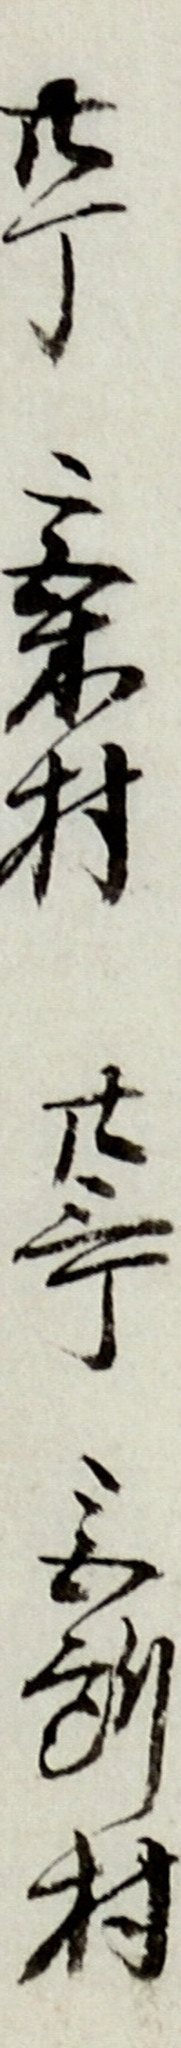廿丁宮木村廿三丁宮所村
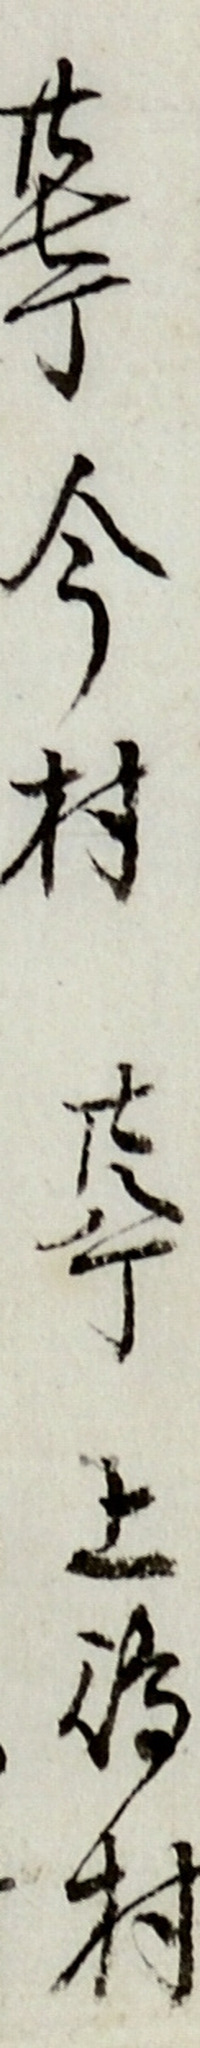廿七丁今村廿八丁上島村
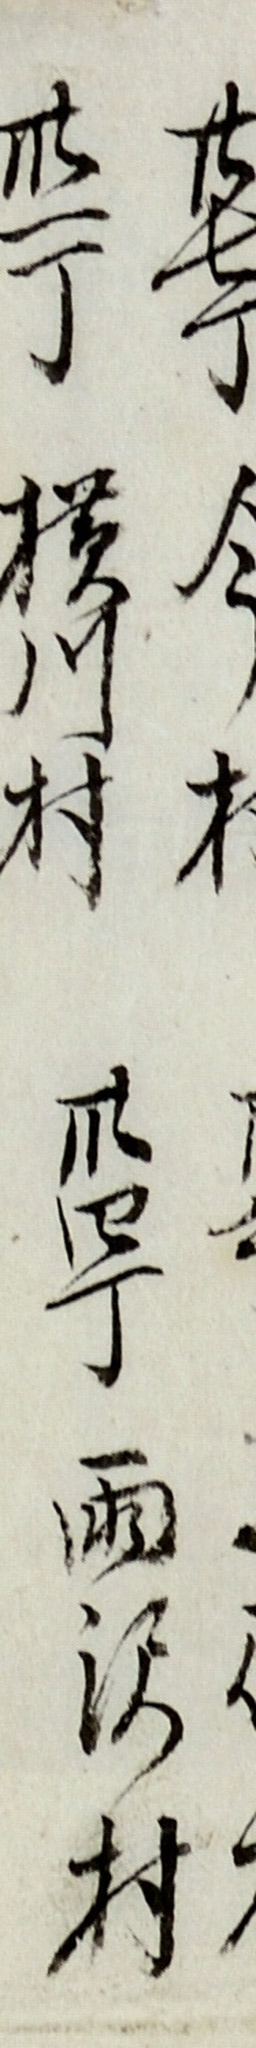卅一丁横川村卅四丁雨沢村

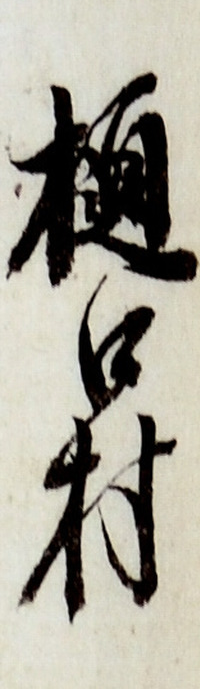樋口村
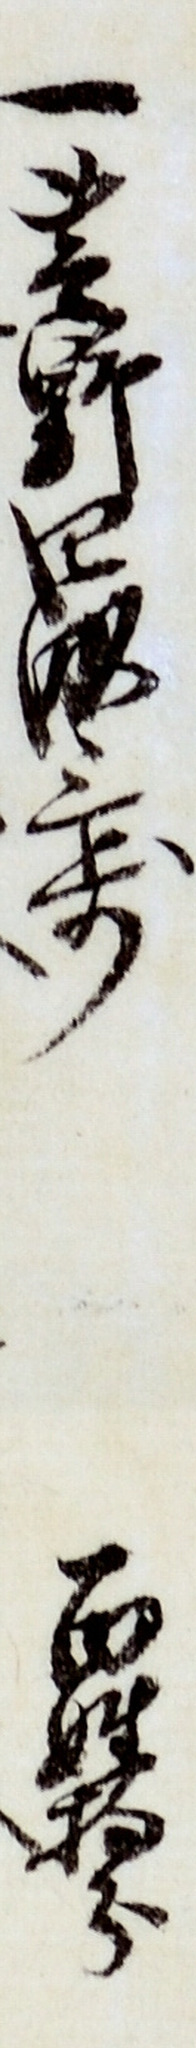一芝野四畝三歩百姓持分
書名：御領分中山林社地手控
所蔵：伊那市立高遠町図書館・合同会社AMANE
